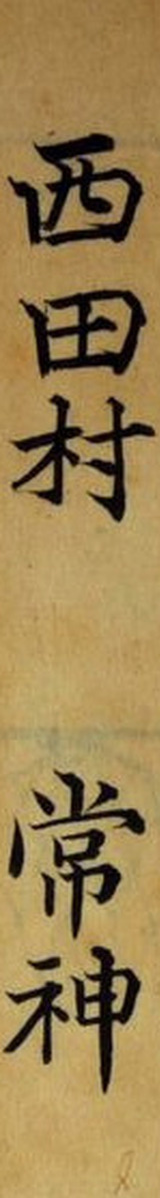西田村常神

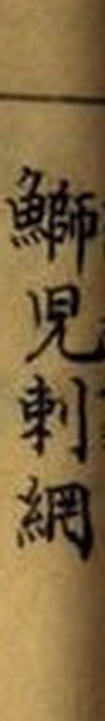鰤児刺網

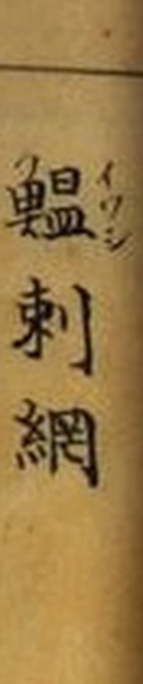鰛刺網

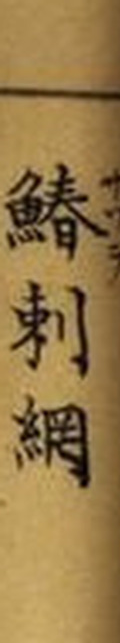鰆刺網

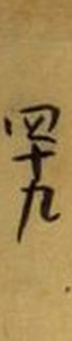四十九
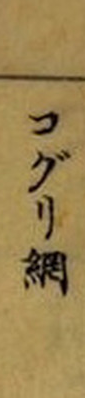コグリ網

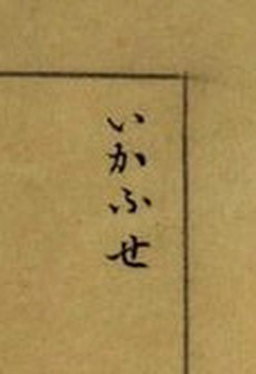いかふせ

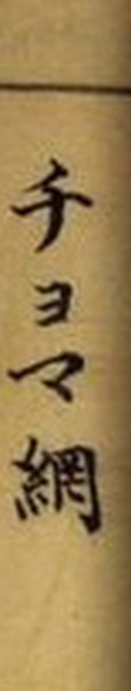チョマ網

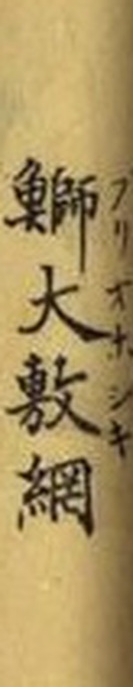鰤大敷網

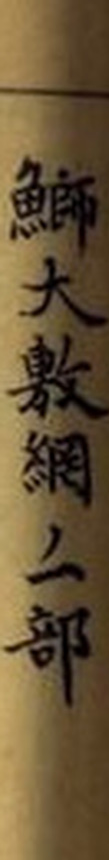鰤大敷網ノ一部

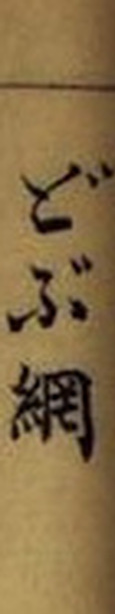どぶ網

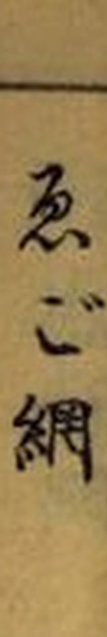ゑご網

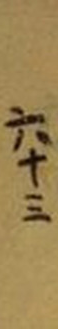六十三
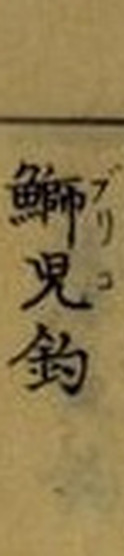鰤児釣

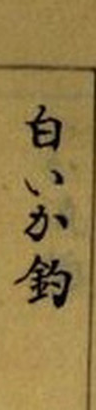白いか釣

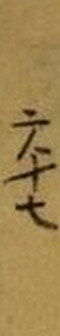六十七
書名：漁具図 若狭海ノ部[画像あり]
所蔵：福井県文書館 Fukui Prefectural Archives
